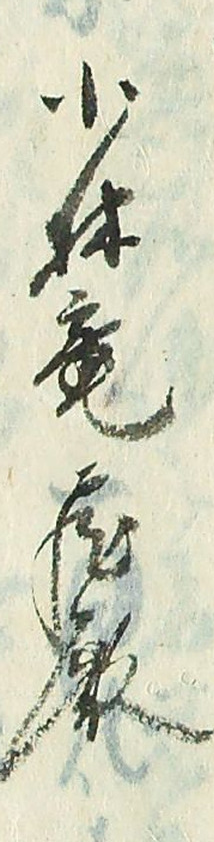小林竜蔵殿

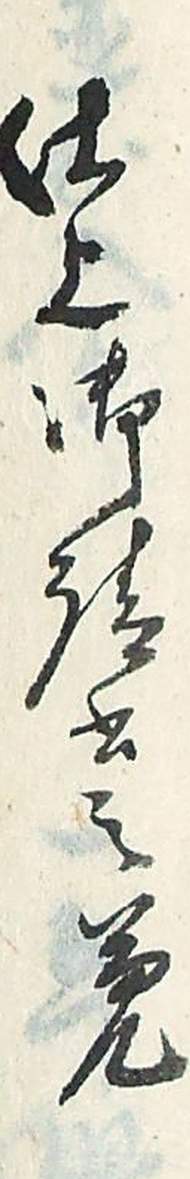仕上御請書之覚
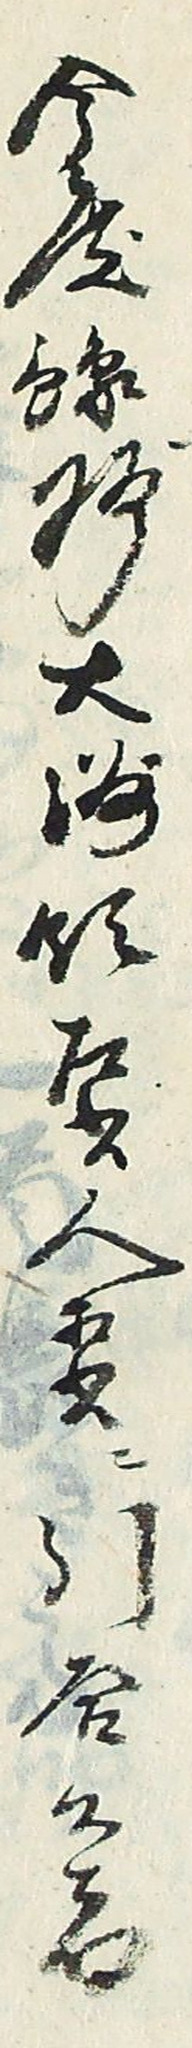今度豫州大洲領左書人相書に引合候者
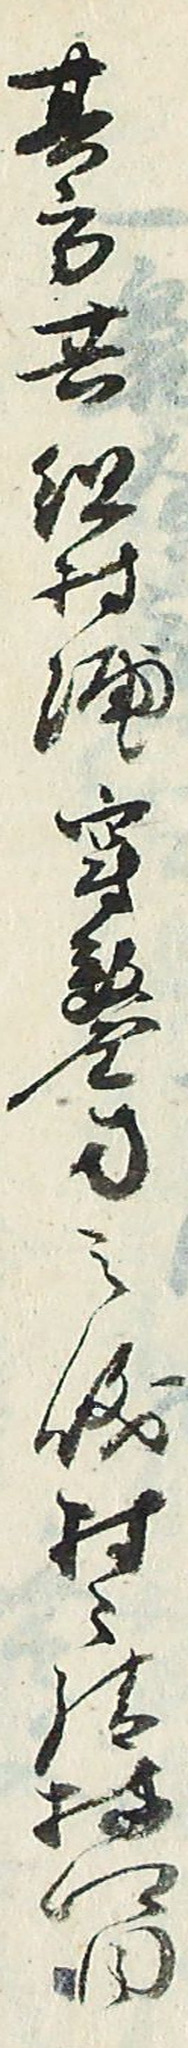其方共組村浦穿鑿方之儀村々請持郷目
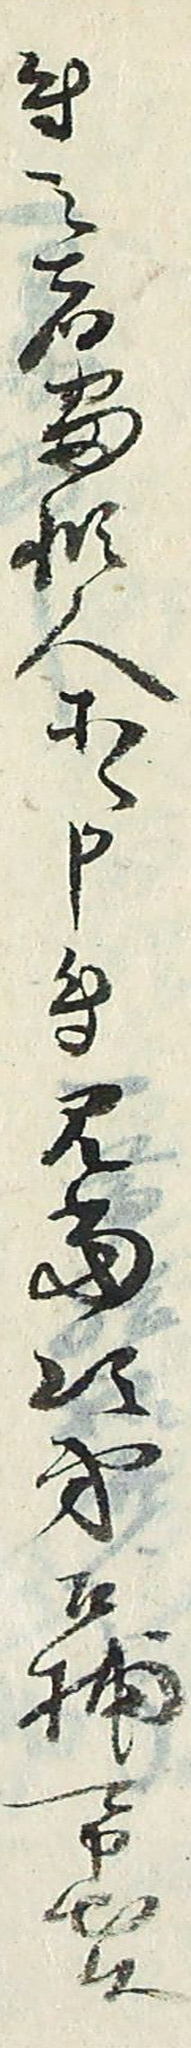付之者番非人等へ申付見当次第召捕可申出候
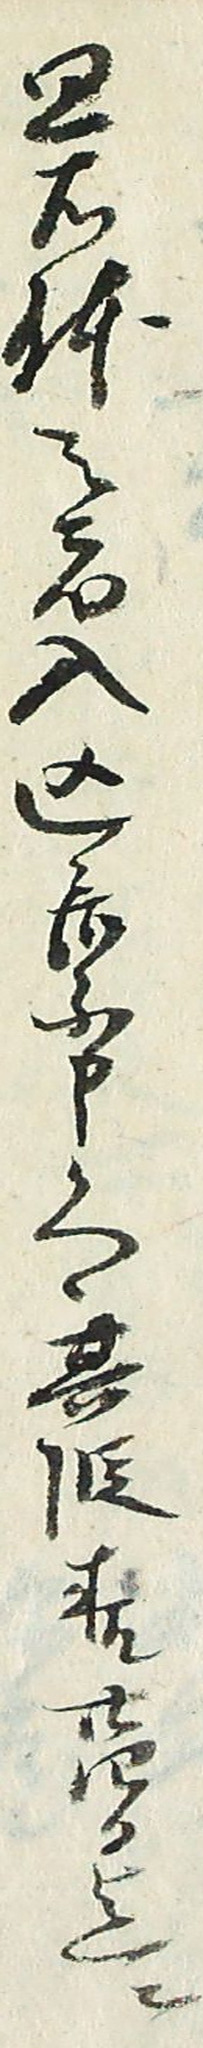且右体之者入込居不申候はゝ其段来る廿四日迄に
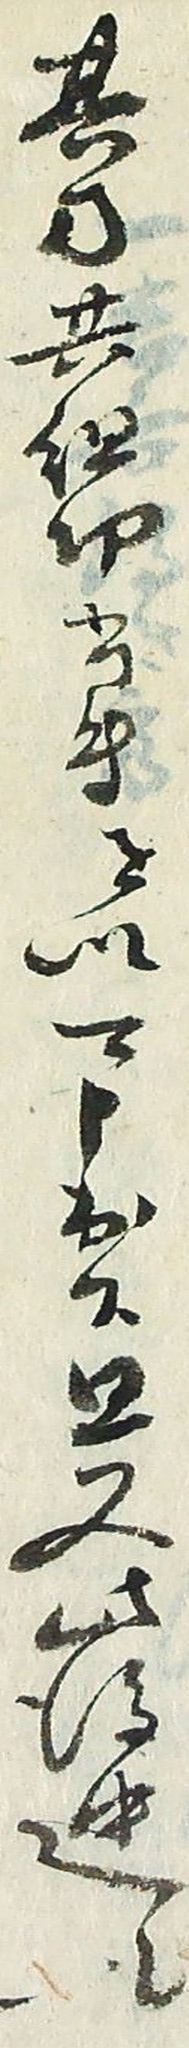其方共組切書付を以可申出候且又此後迚も
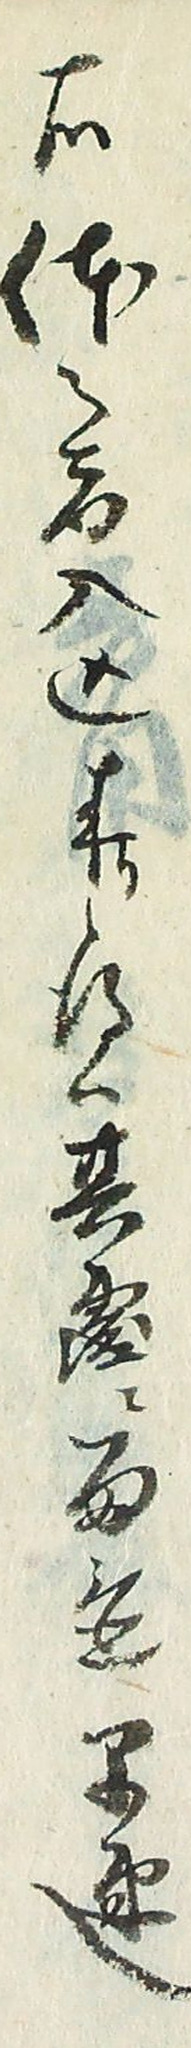右体之者入込来り候得は其処に留置早速
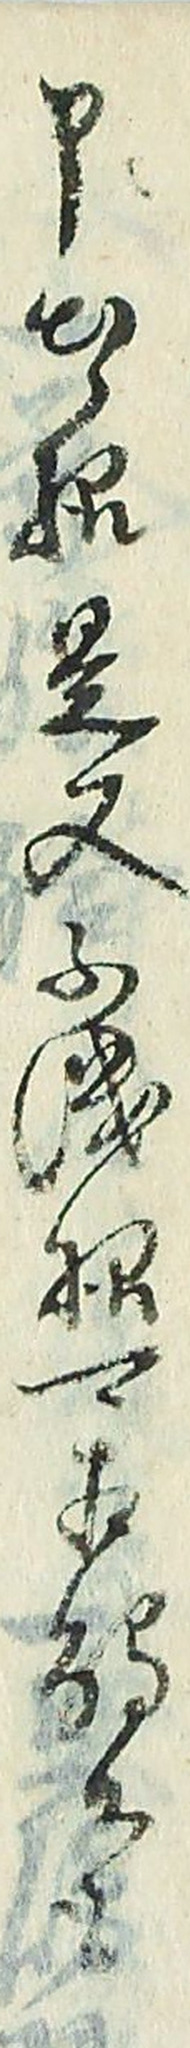申出候様是又不洩様可相触候以上
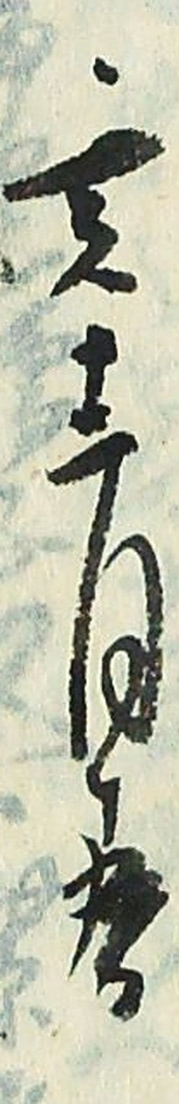亥十二月十九日
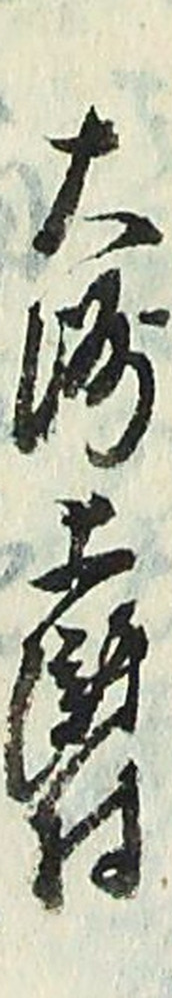大洲上灘村
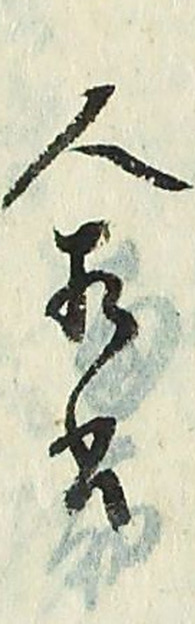人相書
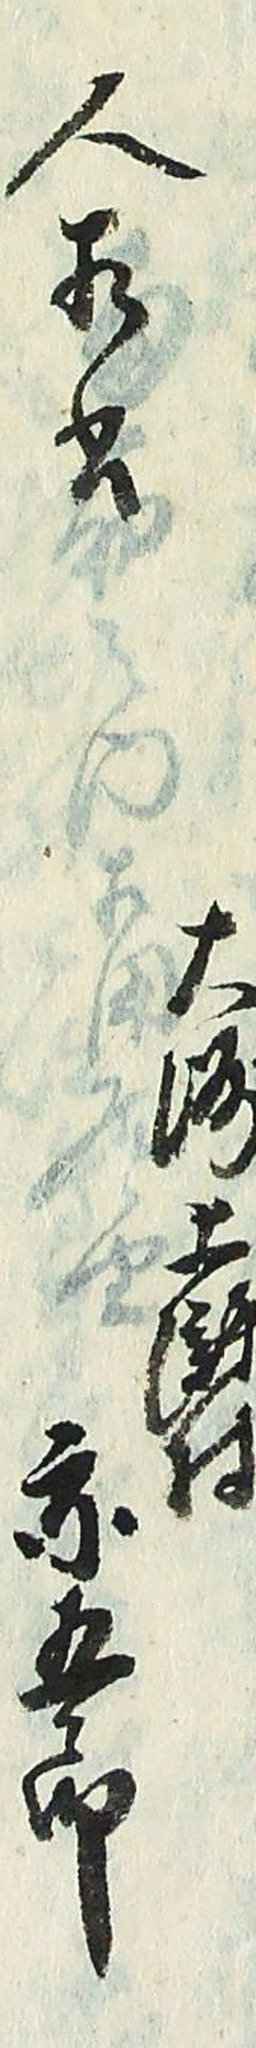人相書
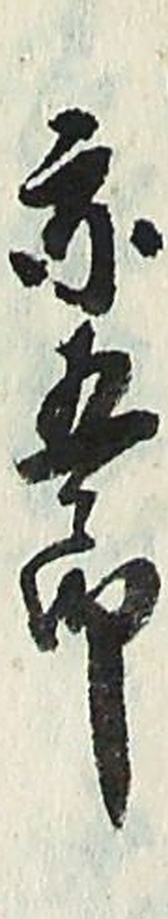亦五郎
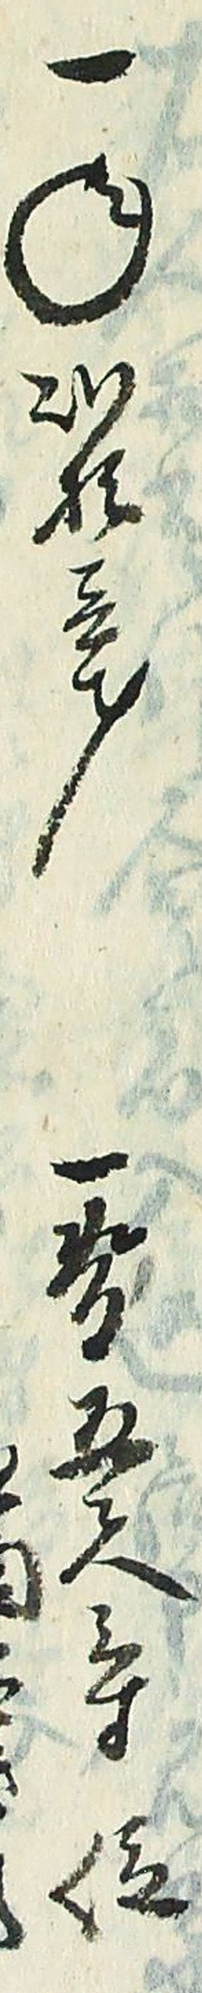一年弐拾壱才一背五尺三寸位
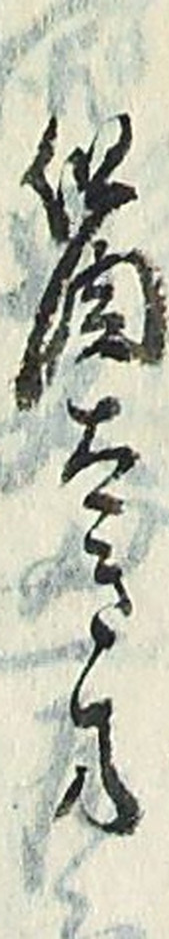但胴太き方
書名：諸御用御□受書控
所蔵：鳴門教育大学 Naruto University of Education
